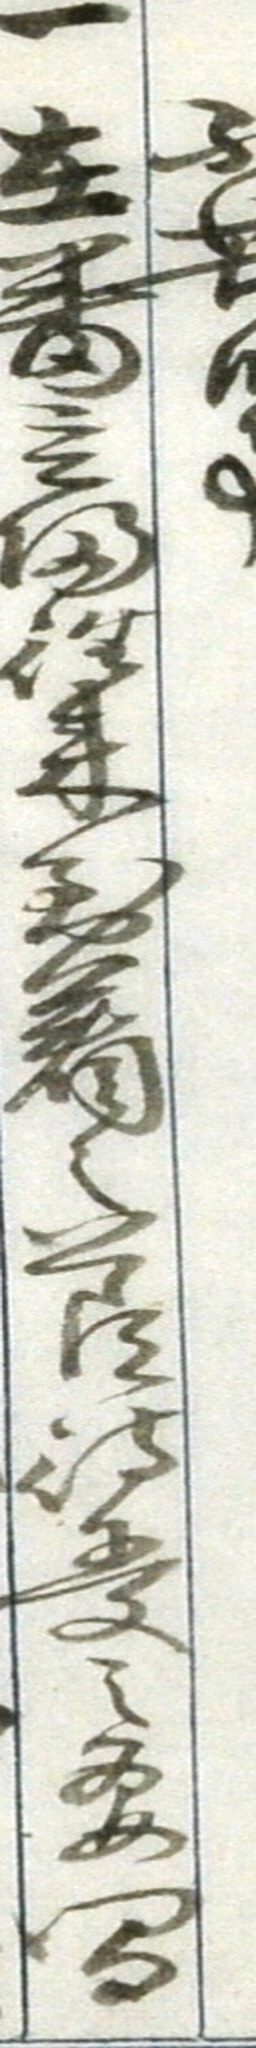一在番立帰往来到着之節待受之要間
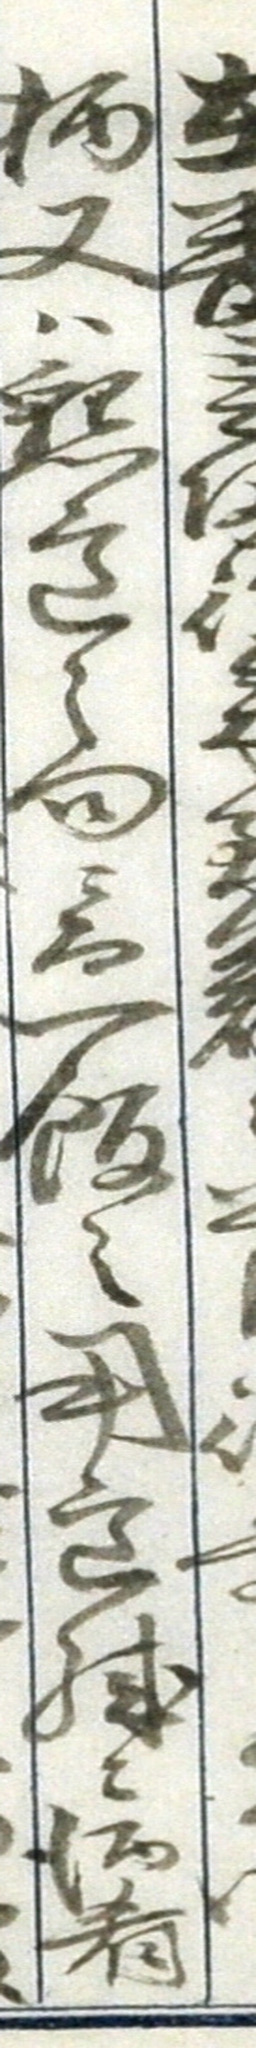柄又ハ懇意之向ニ而一飯之用意殊ニ酒肴
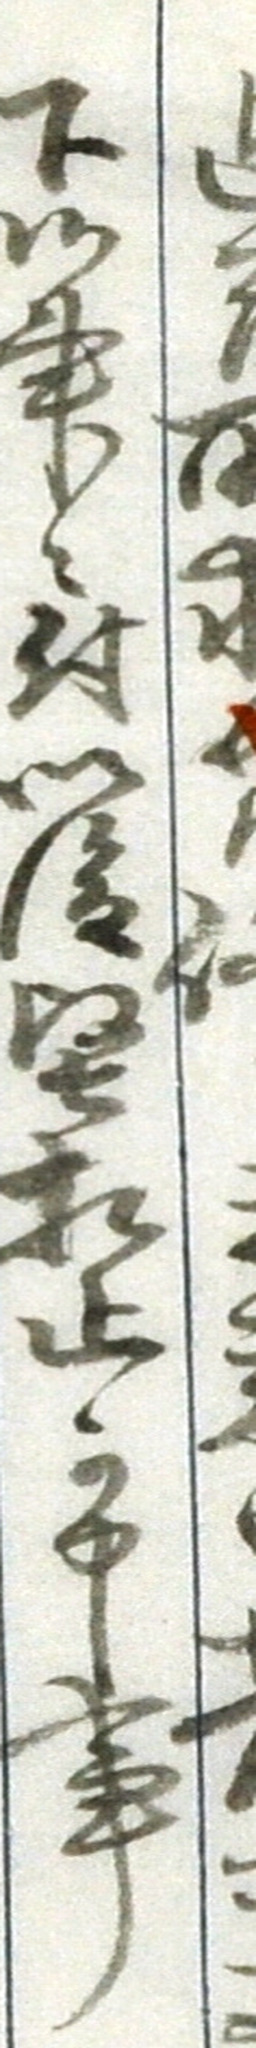下候事ニ付以後堅相止可申事
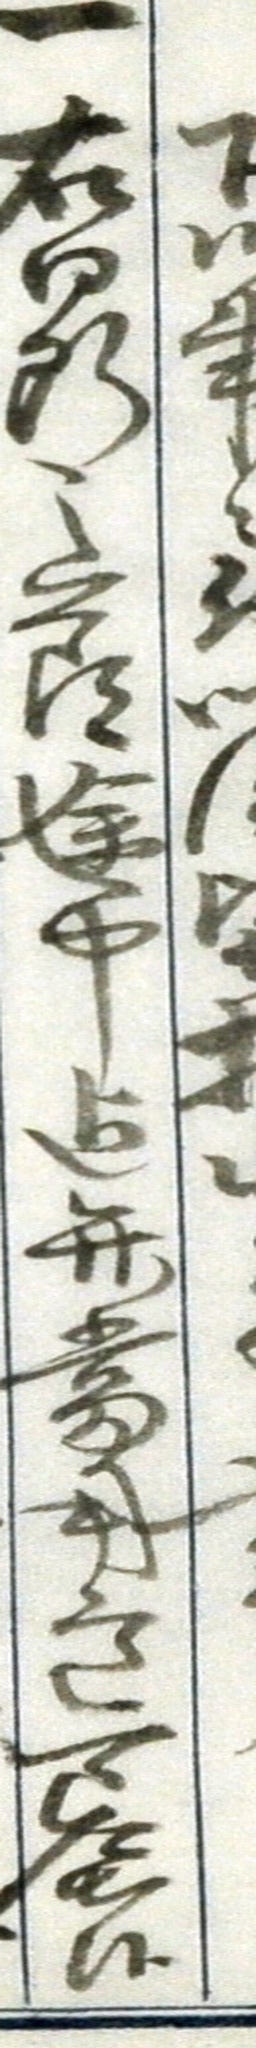一右同断之節途中迄弁当用意差出候
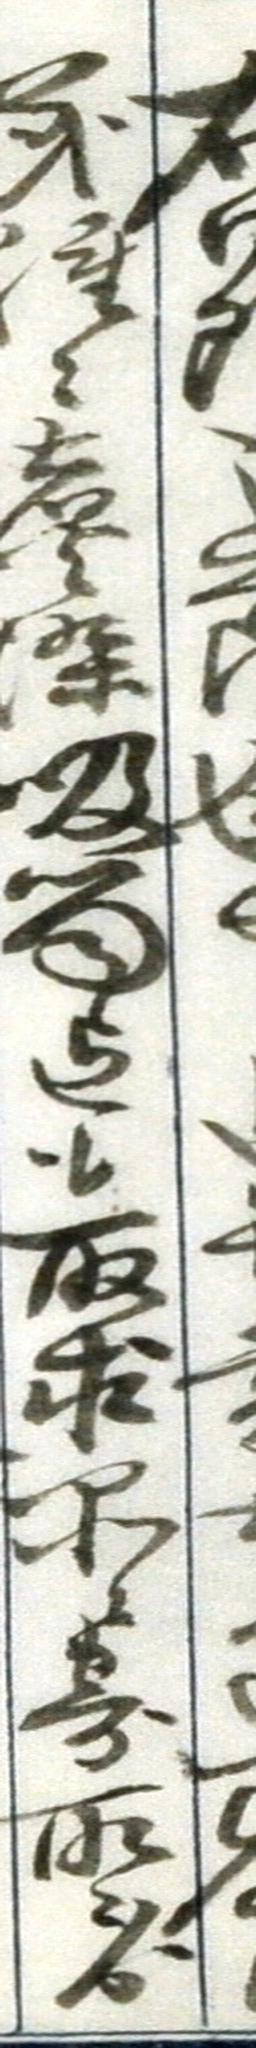義種々煮染吸筒迄も取求品ニ寄所々ゟ
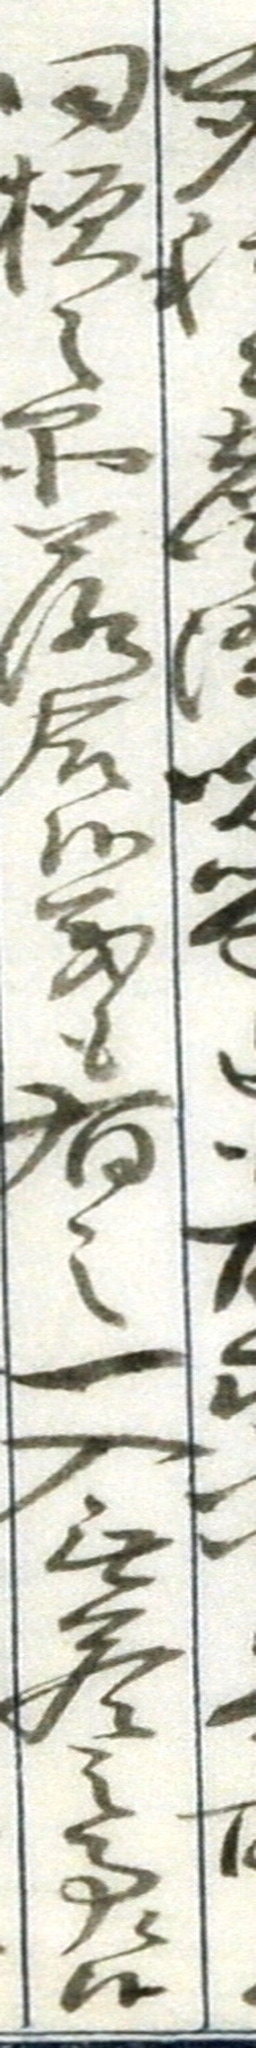同様之品落合候義も有之一入無益之事ニ候
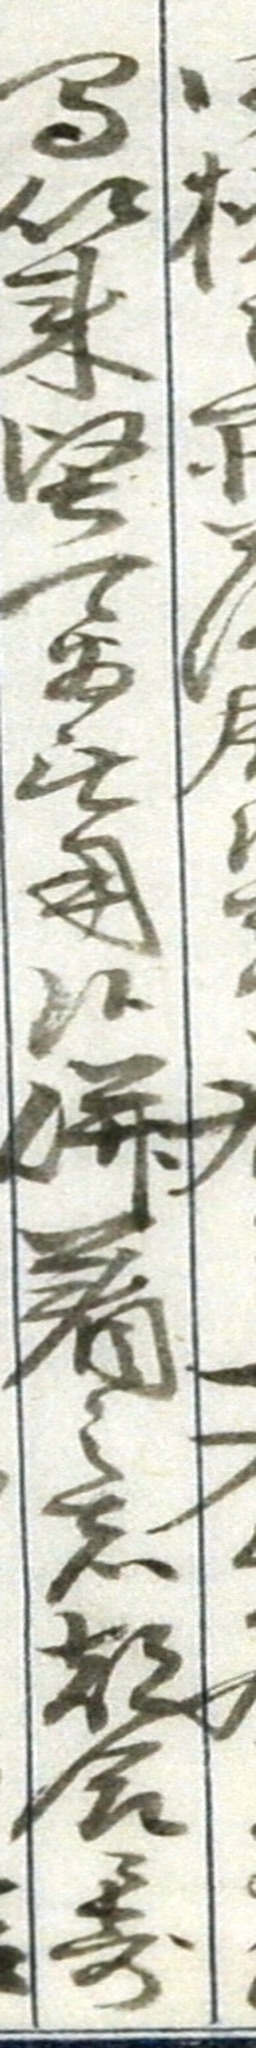間以来堅可為無用候併着之者都合ニ寄
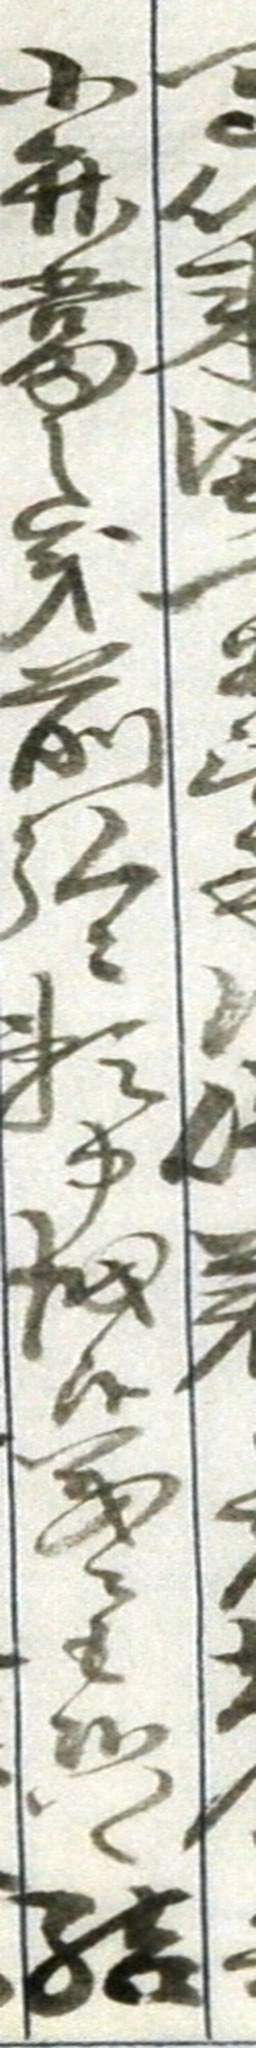小弁当之義前弘ニ頼申越候義ニも候ハヽ結
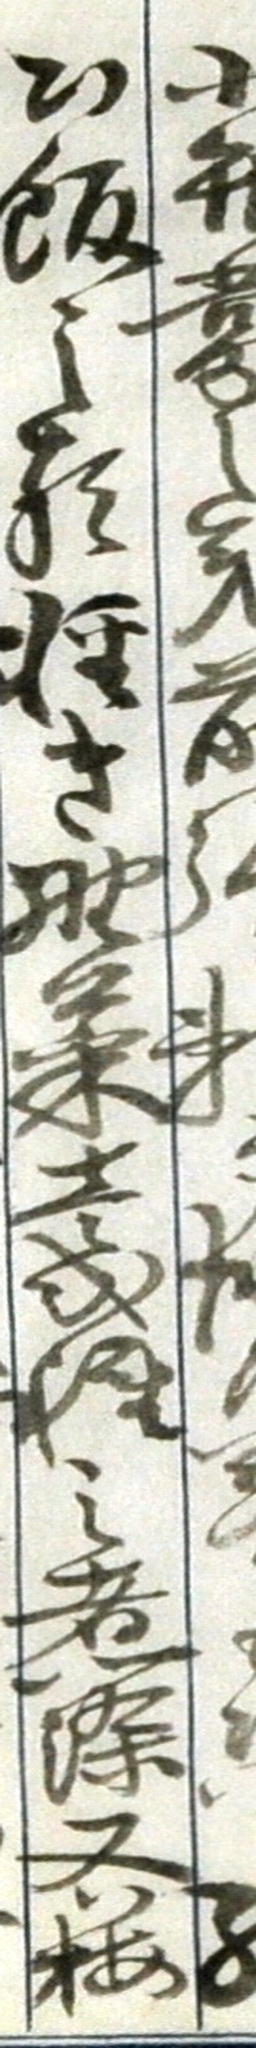ひ飯之類軽き野菜壱弐種之煮染又ハ梅
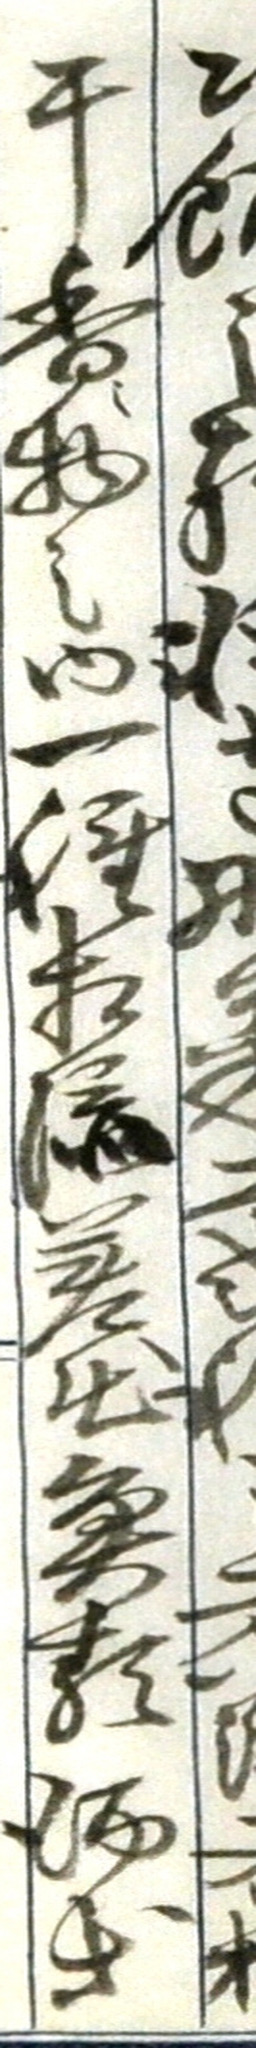干香之物之内一種相添差出魚類酒等

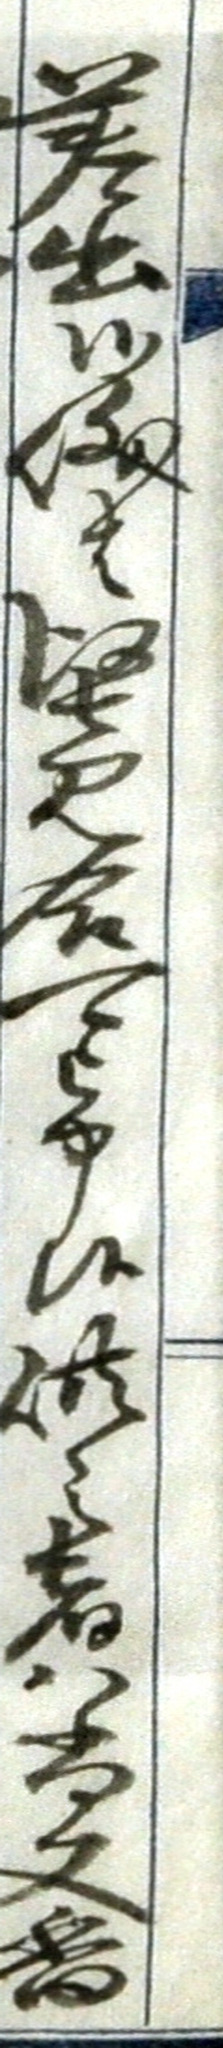差出候儀は堅見合可被申候供之者ハ尚又番香
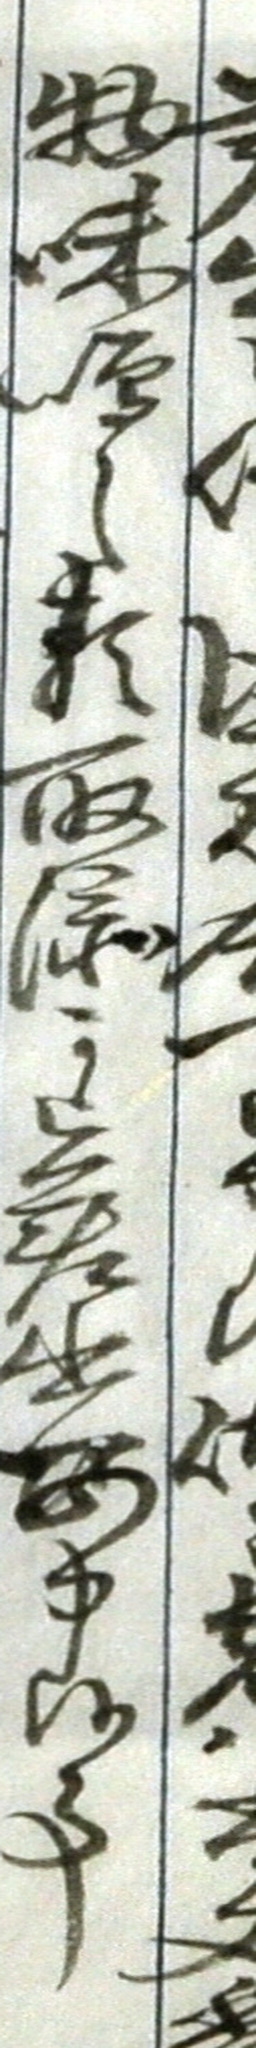物味噌之類取添可被差出可申候事
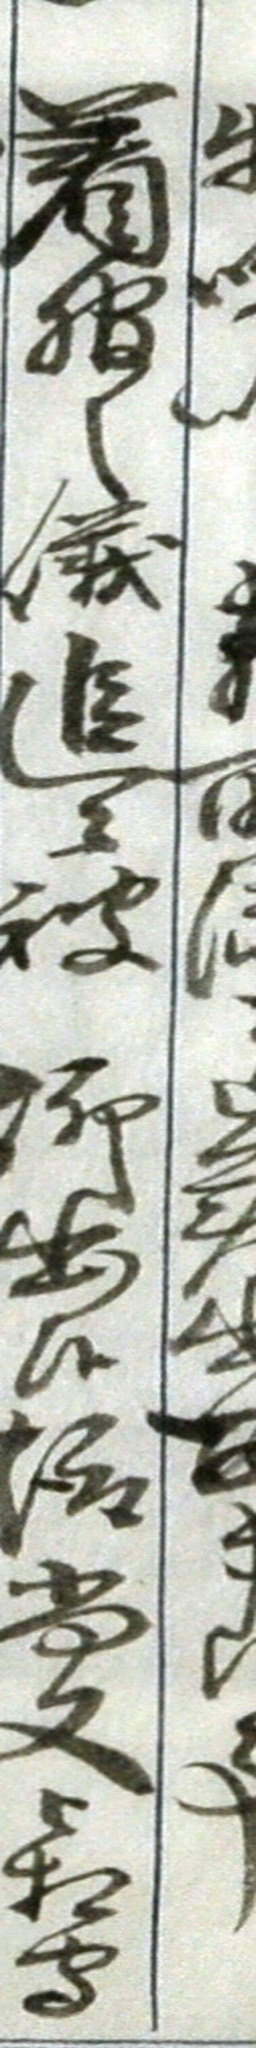一着服之儀追々被仰出候趣尚又被相守
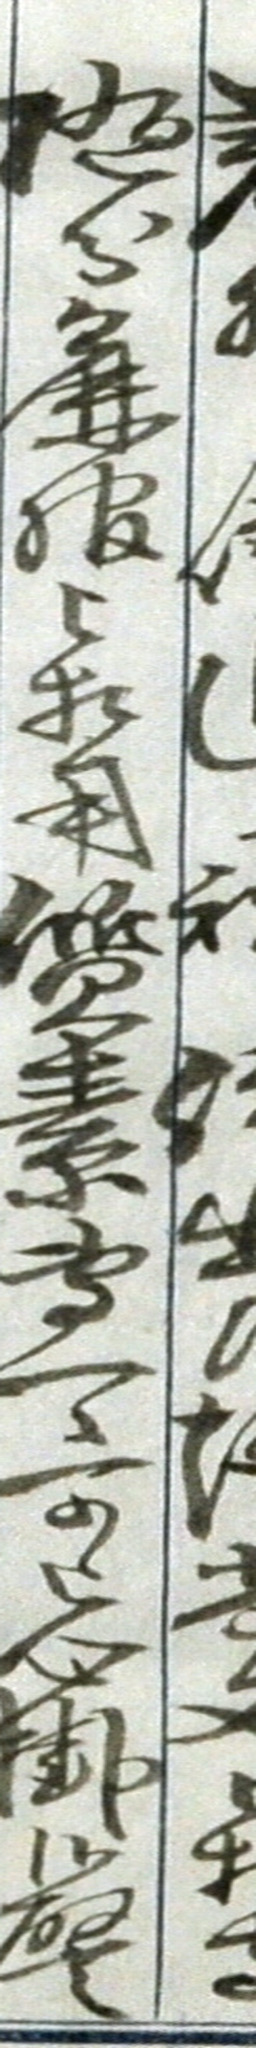随分麁服被相用質素専一ニ可被心掛候譬
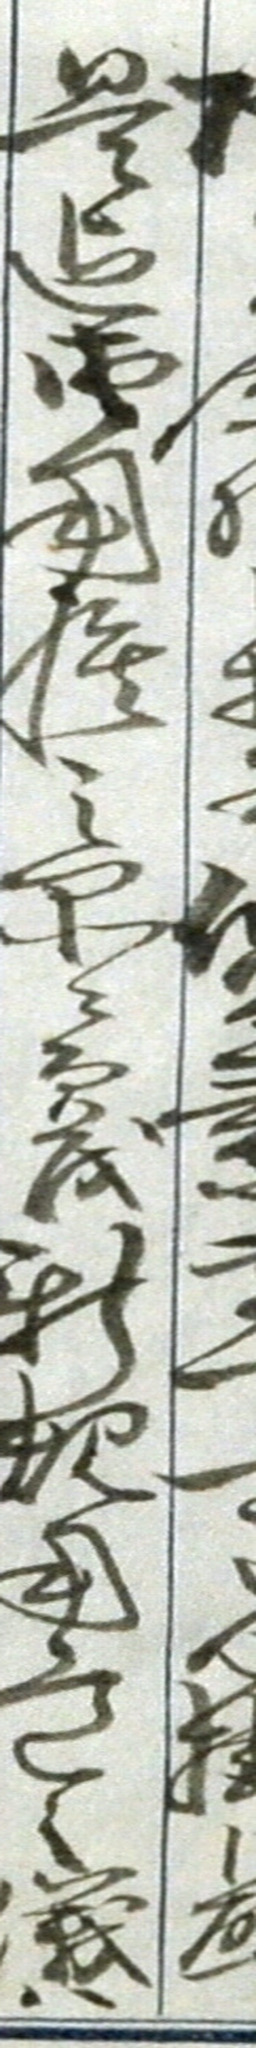是迄御用捨之品ニ而も新規用意之儀ハ
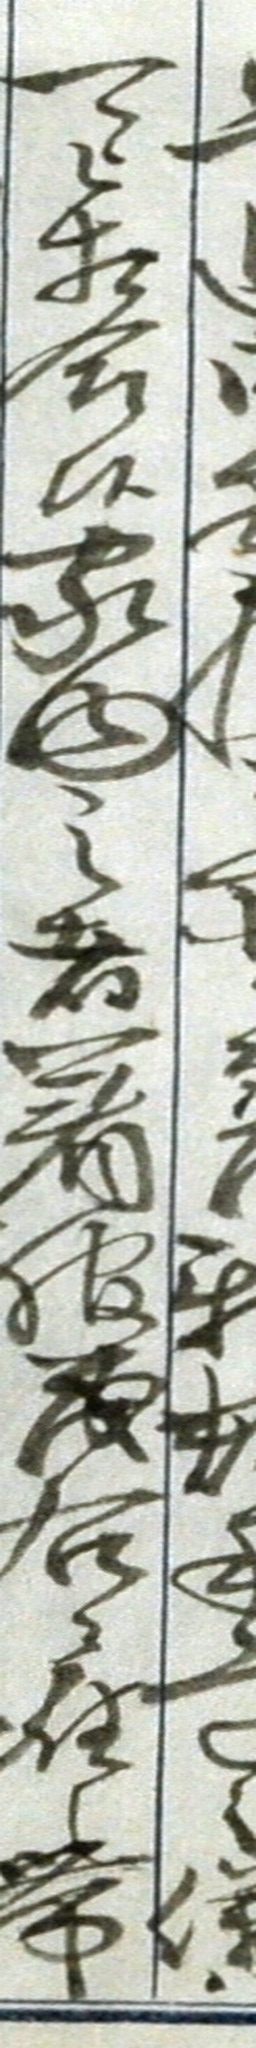可被相合候家内之者着服も右ニ准し帯
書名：御倹約被仰出書
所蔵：伊那市立高遠町図書館・合同会社AMANE
